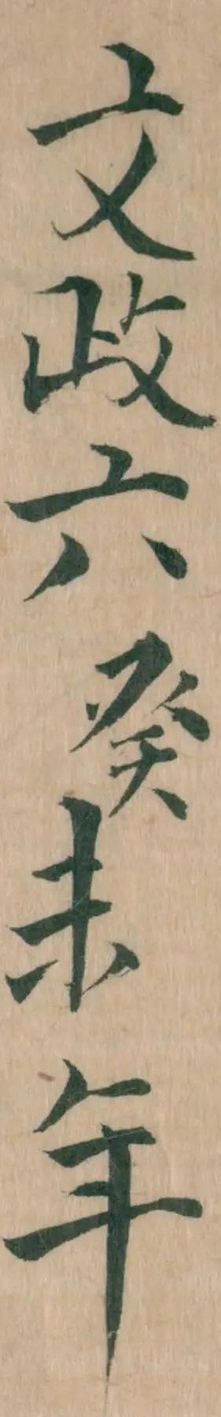文政六癸未年
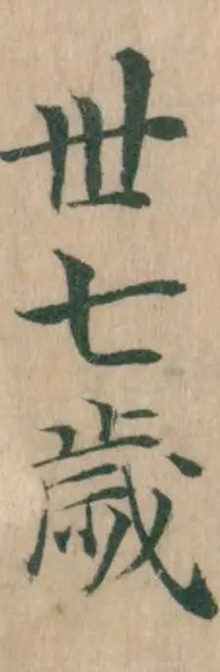卅七歳
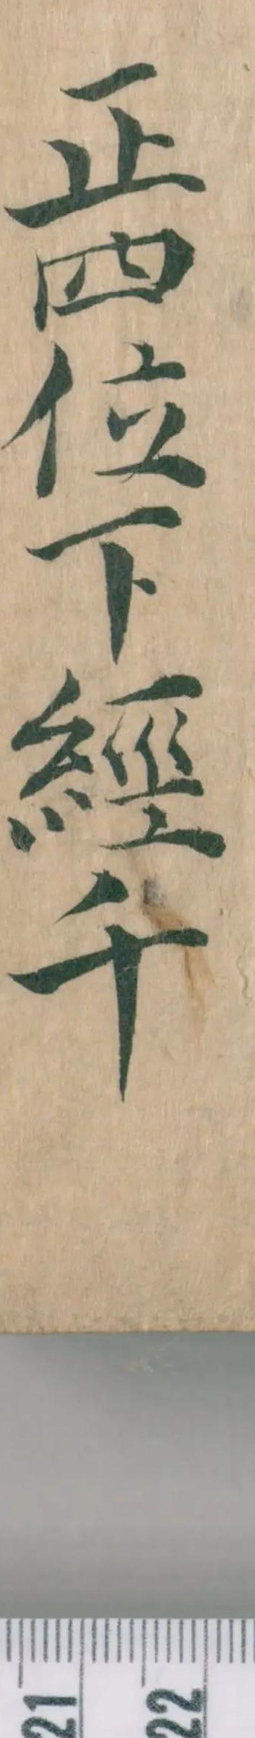正四位下経千
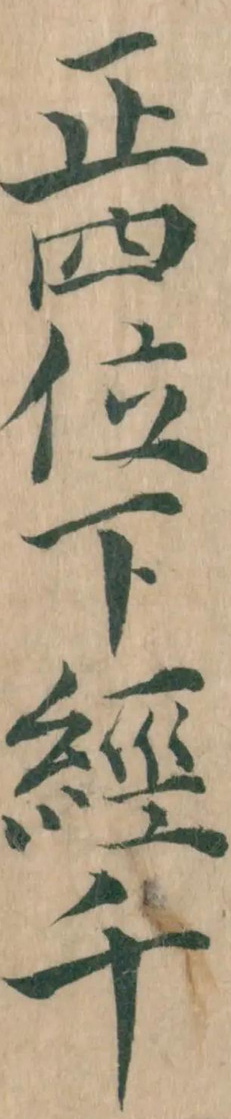正四位下経千

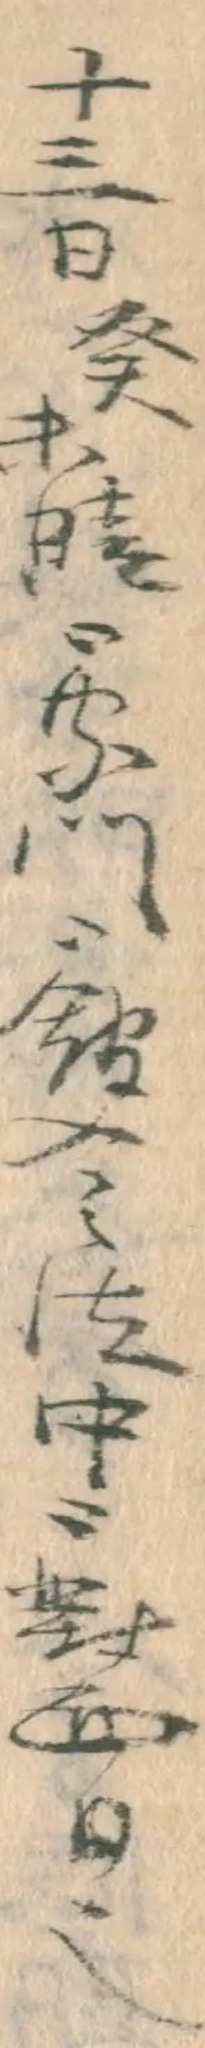十三日癸未晴御家門御館入之法中御対面日也
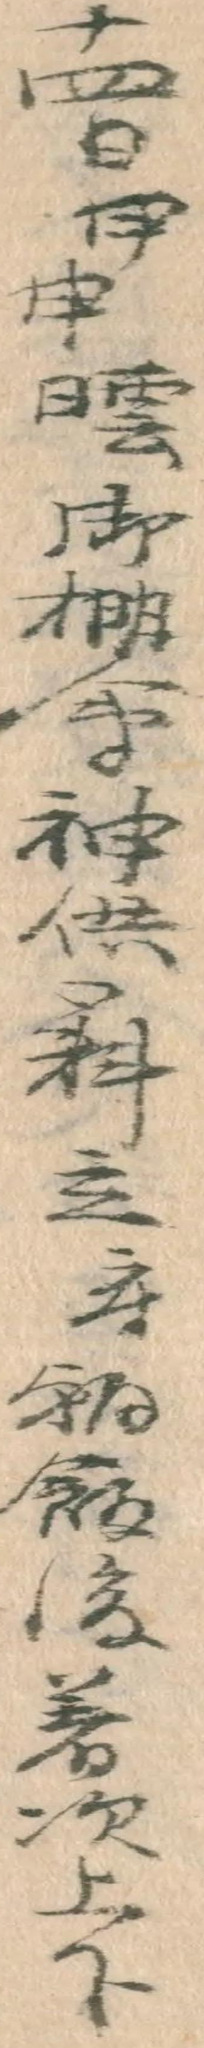十四日甲申曇御棚会神供御料立ニ付朝飯後着次上下
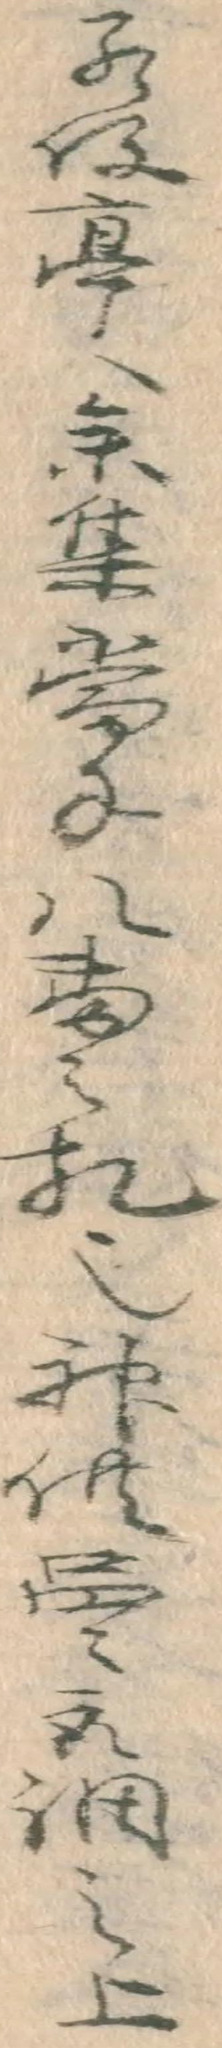若役亭へ参集当年八番之札也神供品々取調之上
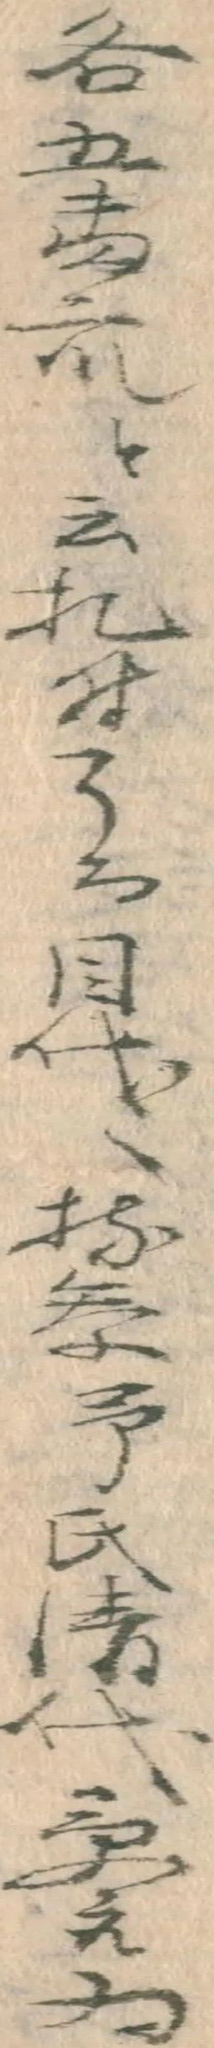各五番衆と云札付了而目代へ持参予氏清代受取為
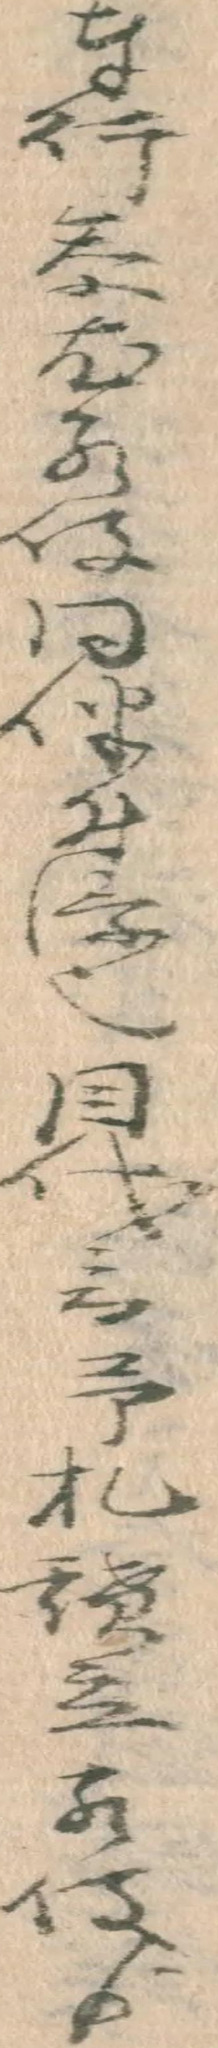奉行参尤若役同伴付添也目代ニ而予札積立若役ゟ
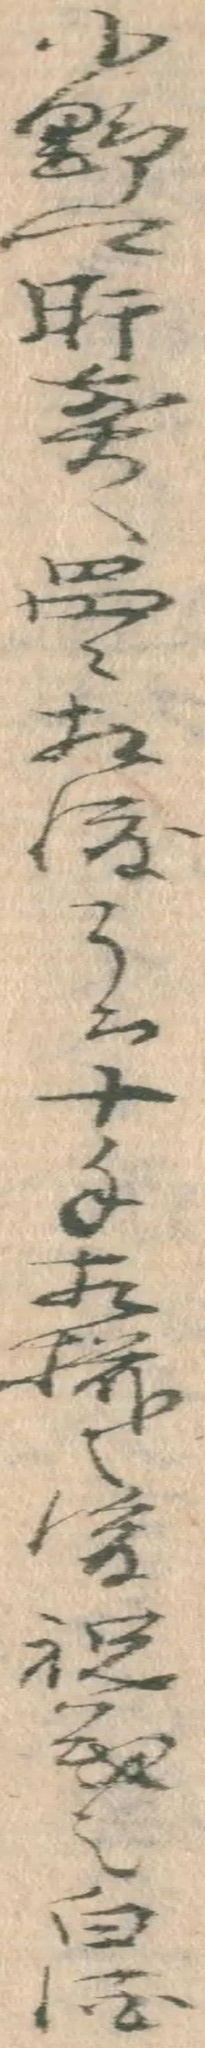小野郷肝煎へ品々相渡了而十手相揃之後祝義之白酒
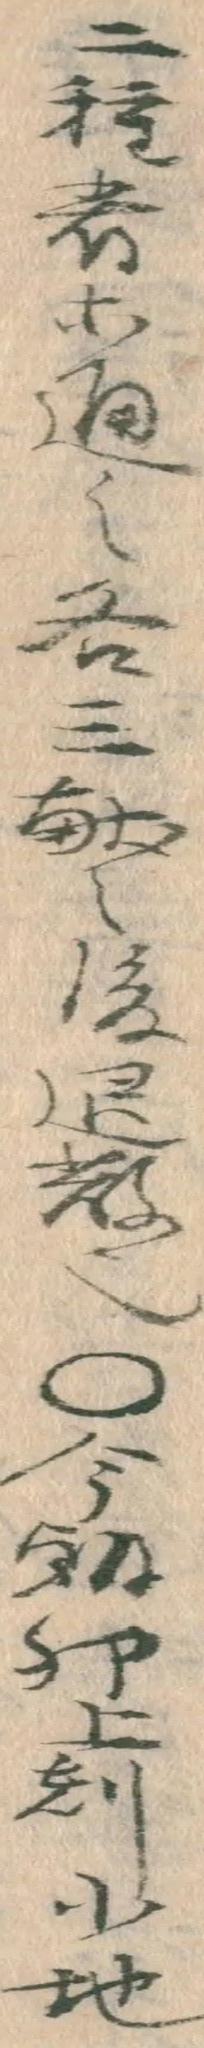二種肴等通之各三献之後退散也○今朝卯上刻小地
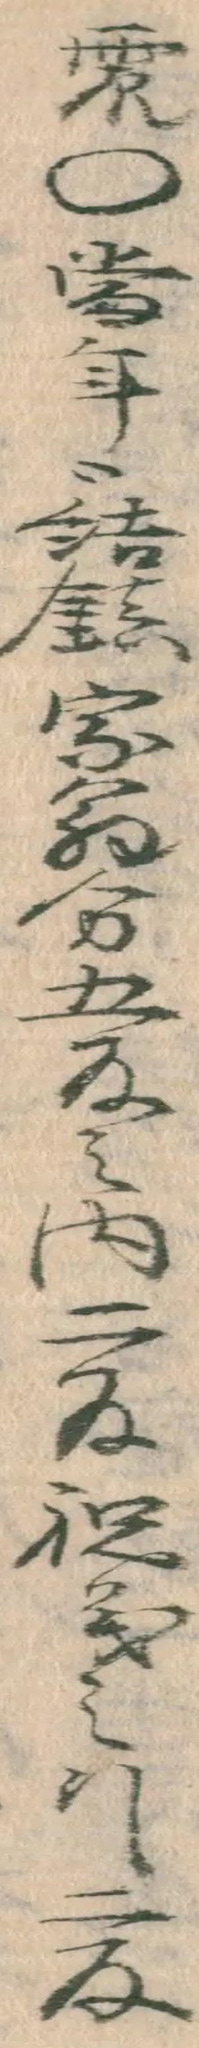震○当年御結鎮家翁分五反之内二反祝義之引二反
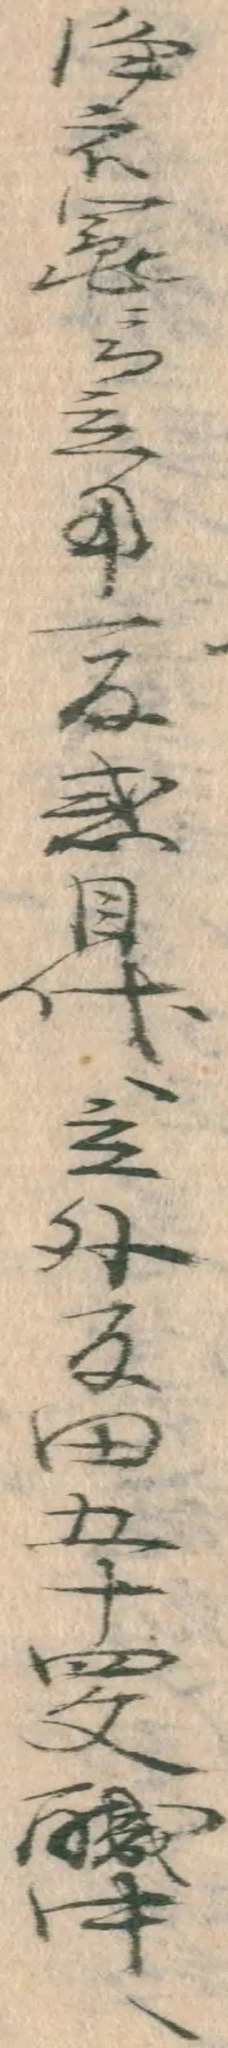浄衣鬮に而立用一反惑目代へ立外反田五十四文職中へ
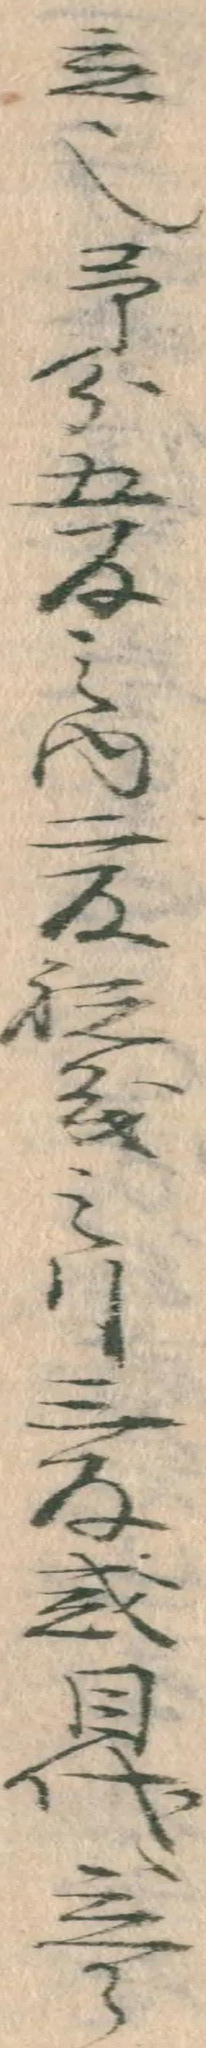立也予分五反之内二反祝義之引三反或目代へ立了
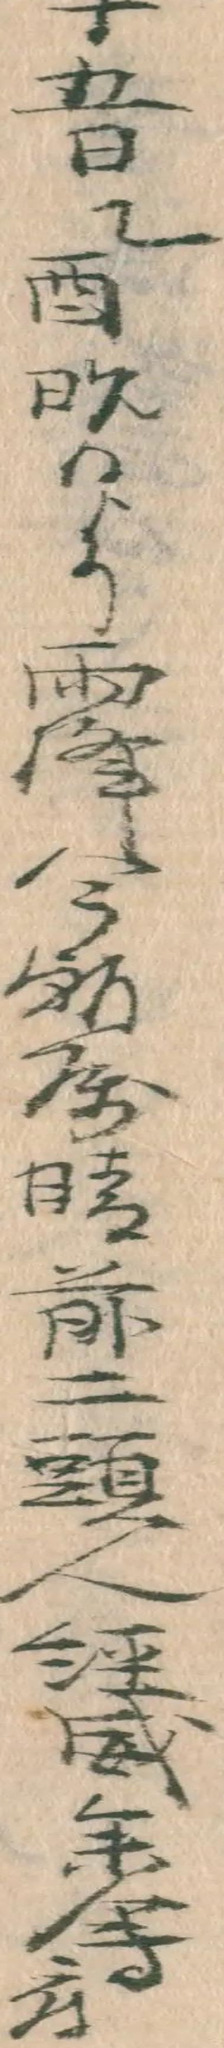十五日乙酉昨日より雨降今朝属晴前二頭人経威参会ニ付
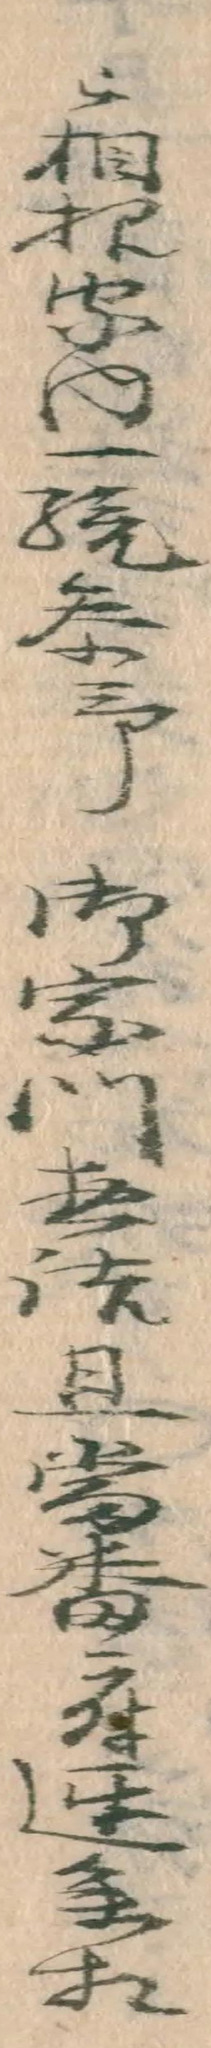被相招家内一統参予御家門惣詰且当番ニ付連参相
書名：賀茂社記録. 第64冊
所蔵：国立国会図書館 National Diet Library, JAPAN
